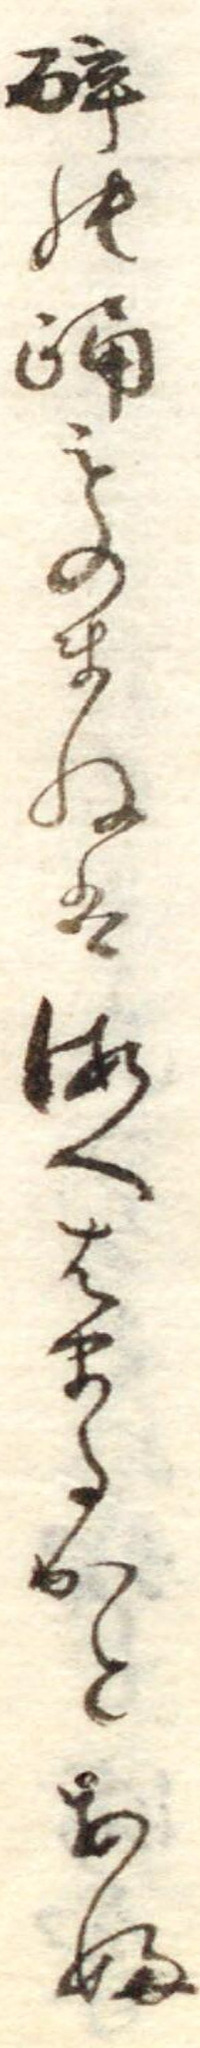酔の踊ものまねは海へはまるかとあふ
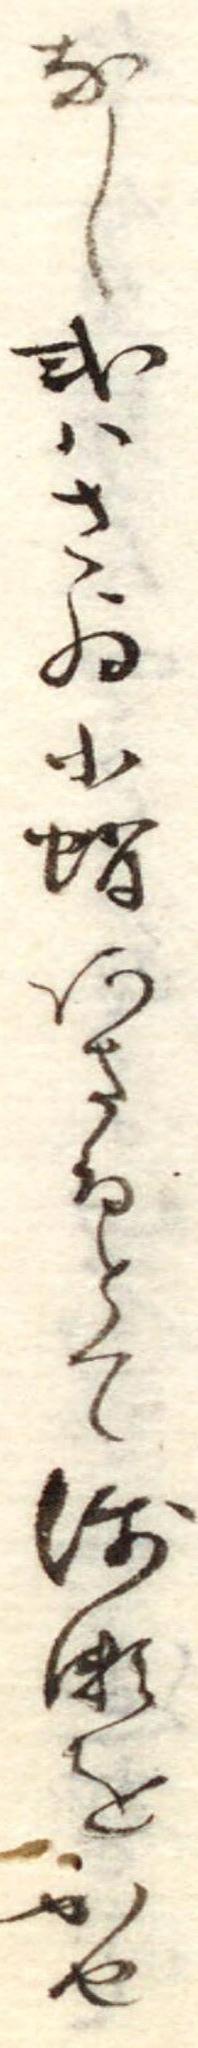なし式はさらゐ小蛸あたるとて浅瀬をかせ
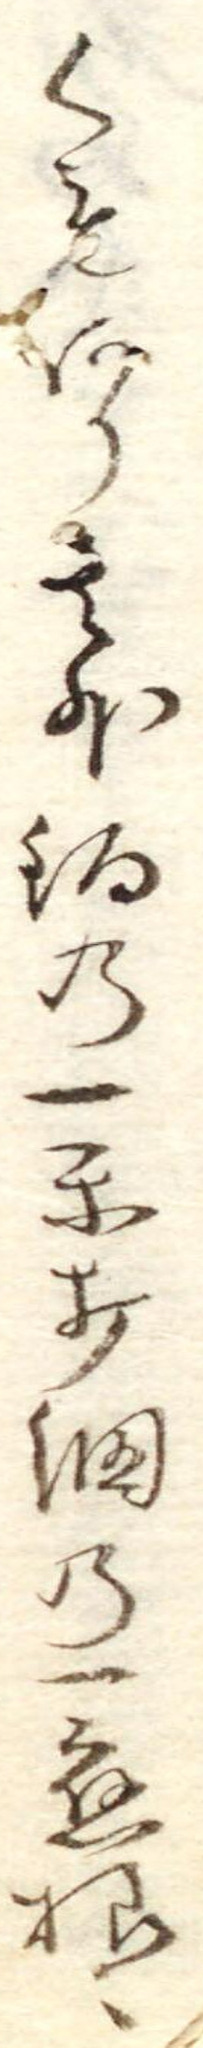くもあり其外釣の一楽打調の一応様々
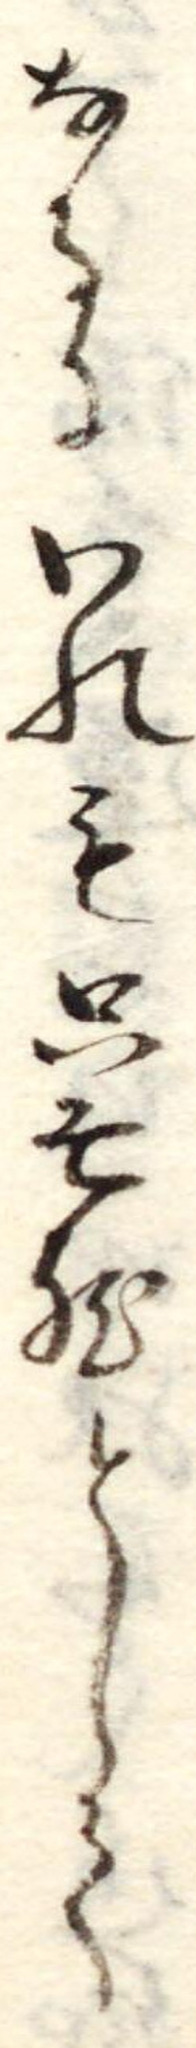なるにわれも只亡然として
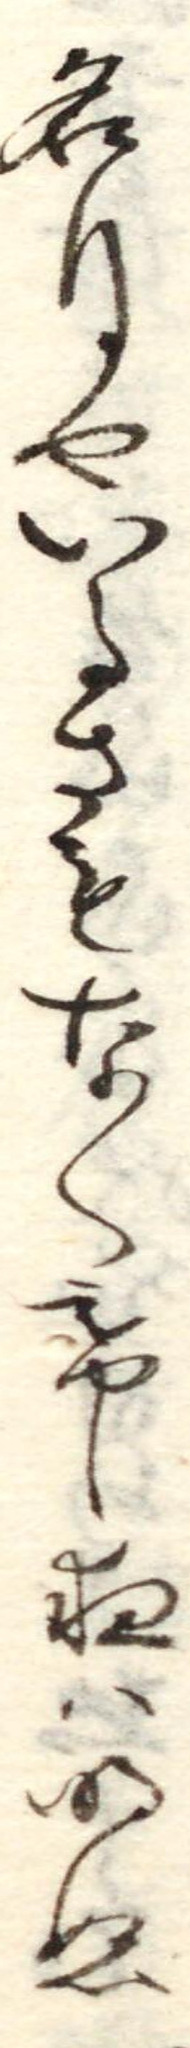名月やいるさもなくけし夜は明けぬ
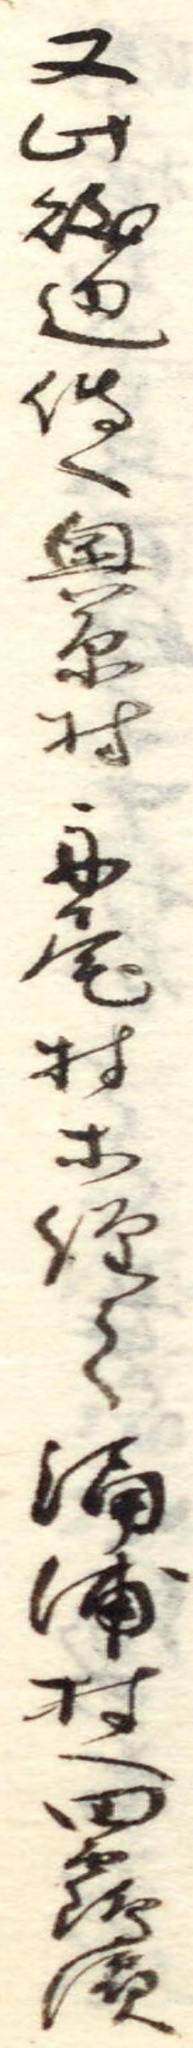又此礒部伝へ奥原村船尾村等経て涌浦村へ田鶴浜
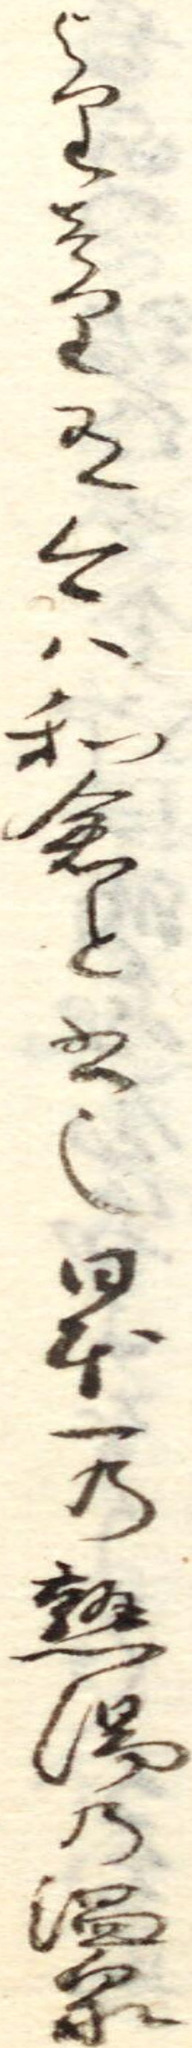より壱里有今は和倉と書也日本一の熟湯の温泉
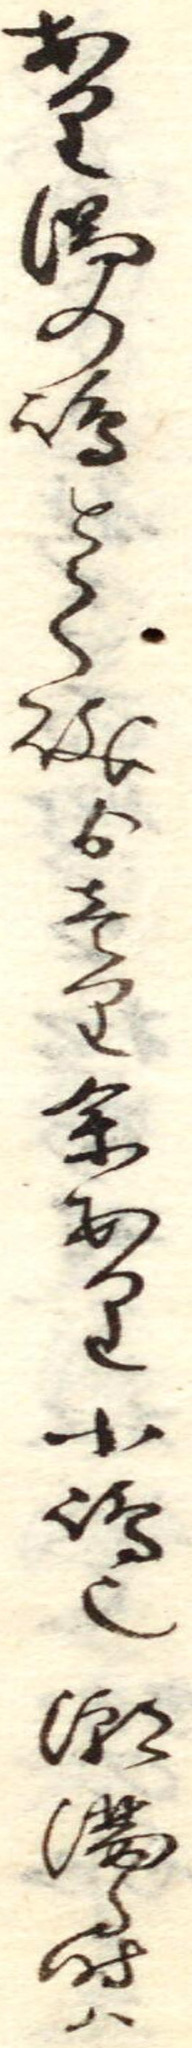あり湯の嶋とて礒ゟ壱里余あり小嶋也漸満る時は
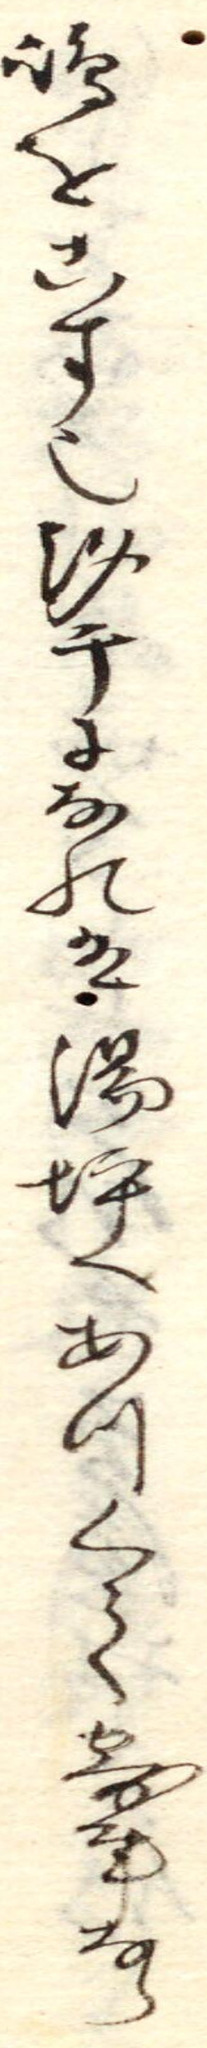嶋をこす也汐干になれは湯坪へあつくて寄事なら
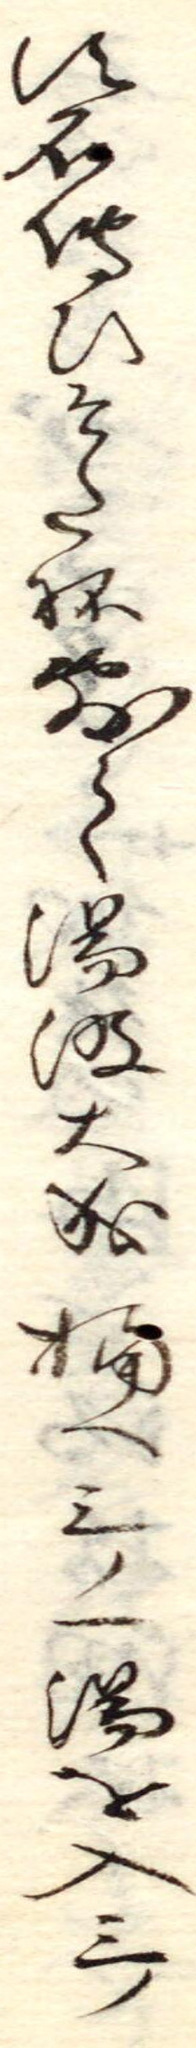す石伝ひそた抔敷て湯汲大成桶へ三ノ一湯を入三ノ
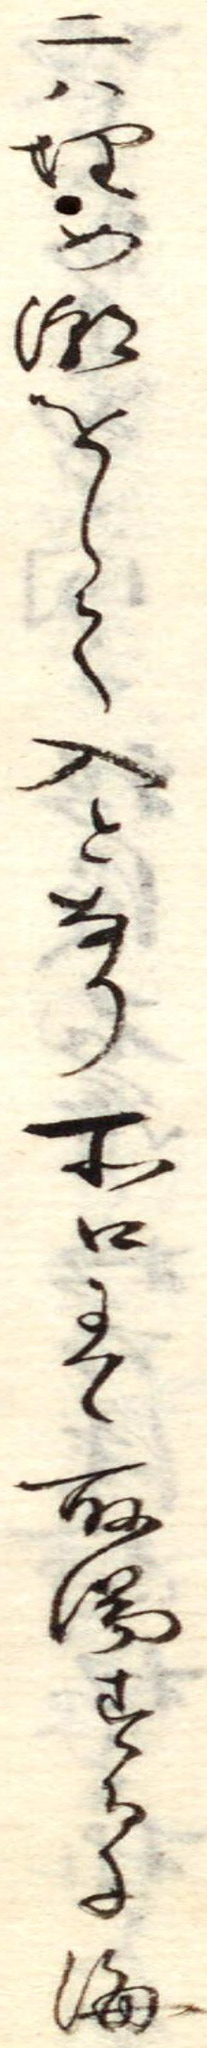二は埋め潮をして入となり所口にて取湯するに海
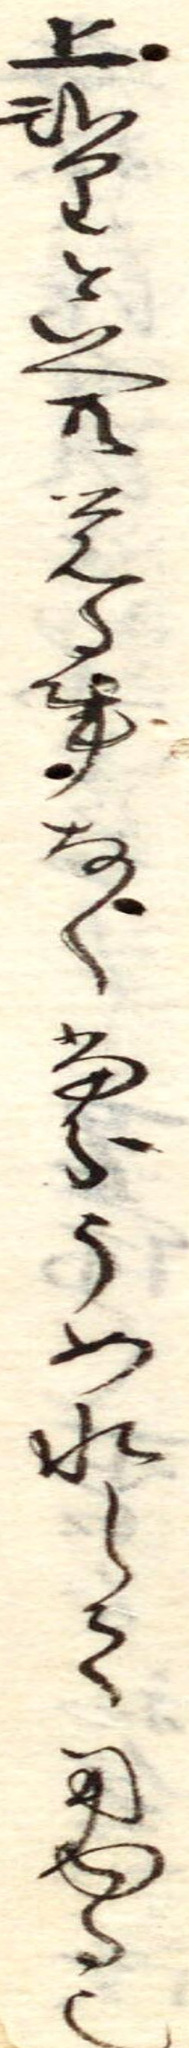上弐里といへ共覚る事なく当分うめ水して用ゆる也
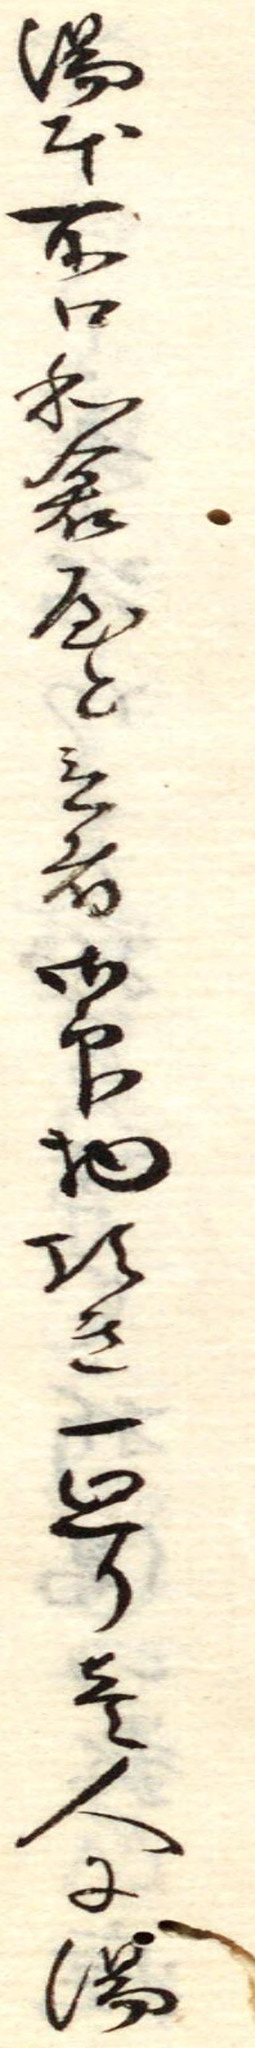湯本所口和倉屋と云者御印物頂き一廻り壱人に湯
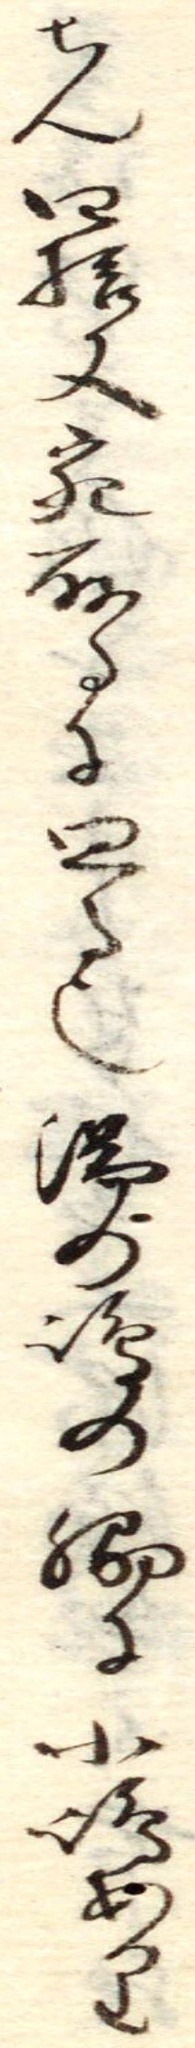ちん四拾文宛取るに廻る也湯の嶋の脇に小嶋あり
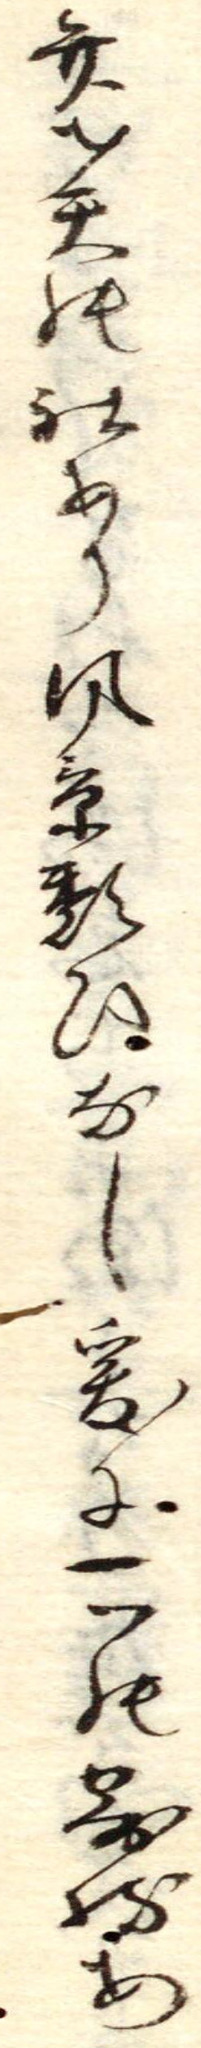弁才天の社あり風景類ひなし爰に一つの寄持あ
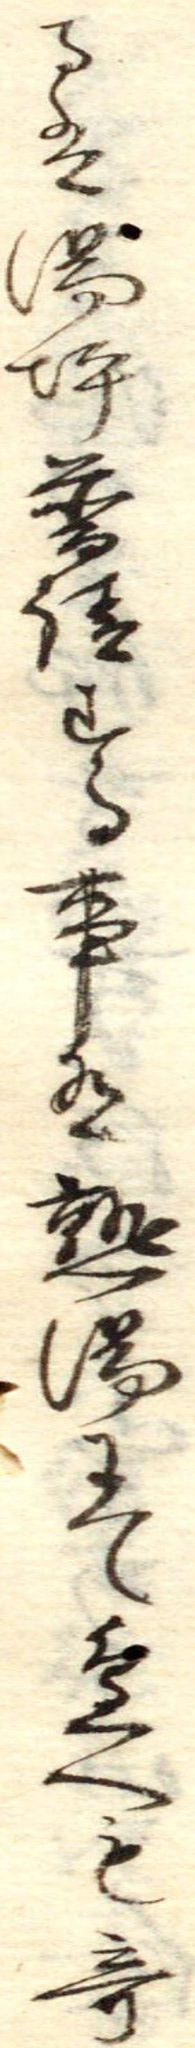るは湯坪普請する事有熟湯にて辺へも奇
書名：能登名跡誌
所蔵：Ishikawa Prefectural Library
